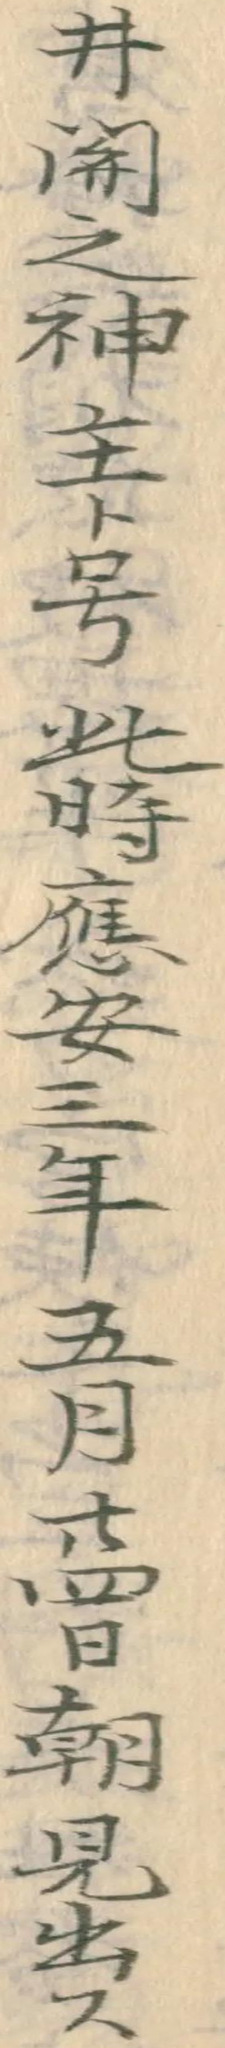井関之神主ト号此時応安三年五月廿四日朝見出ス
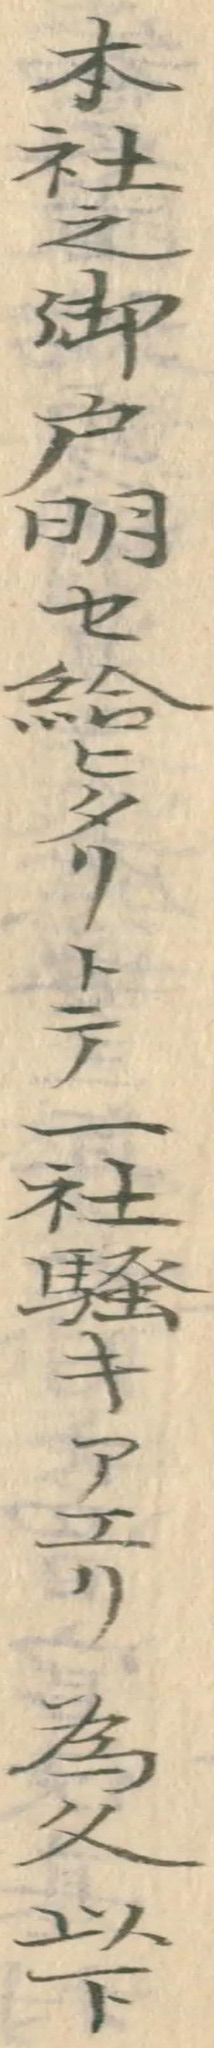本社之御戸明セ給ヒタリトテ一社騒キアヱリ為久以下
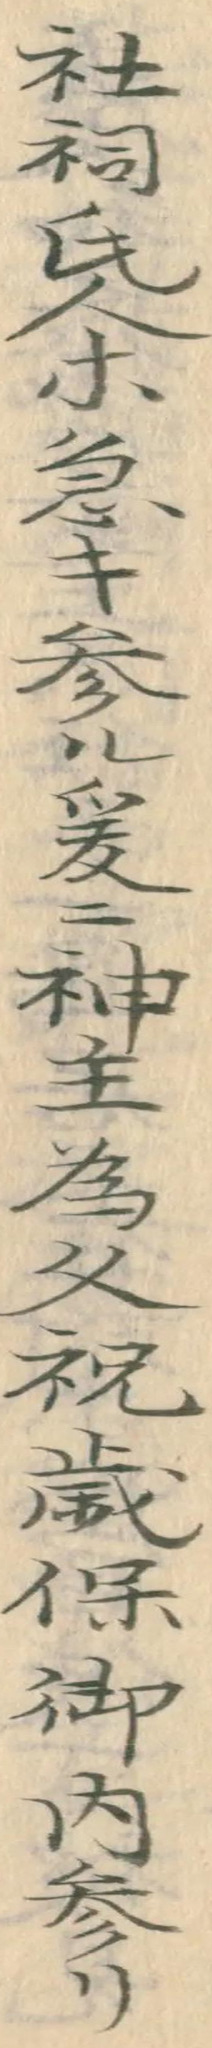社祠氏人等急キ参ル爰ニ神主為久祝歳保御内参リ
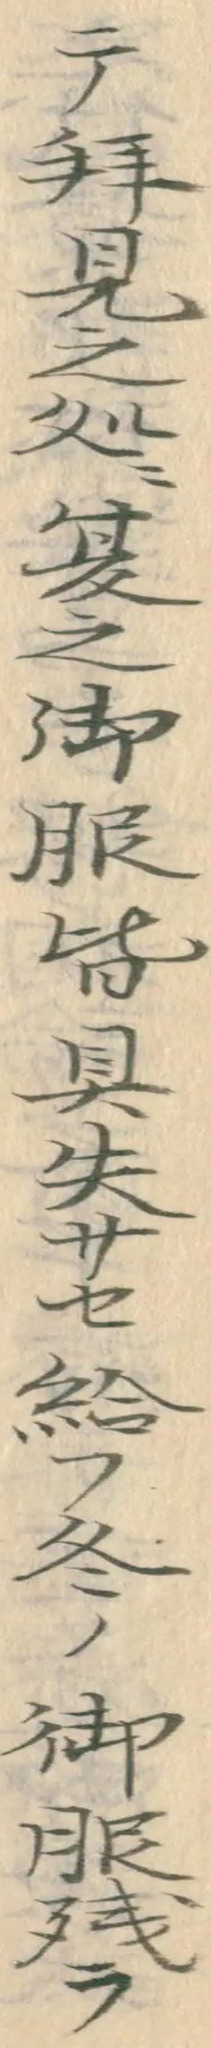テ拝見之処ニ夏之御服皆具失サセ給フ冬ノ御服残ラ
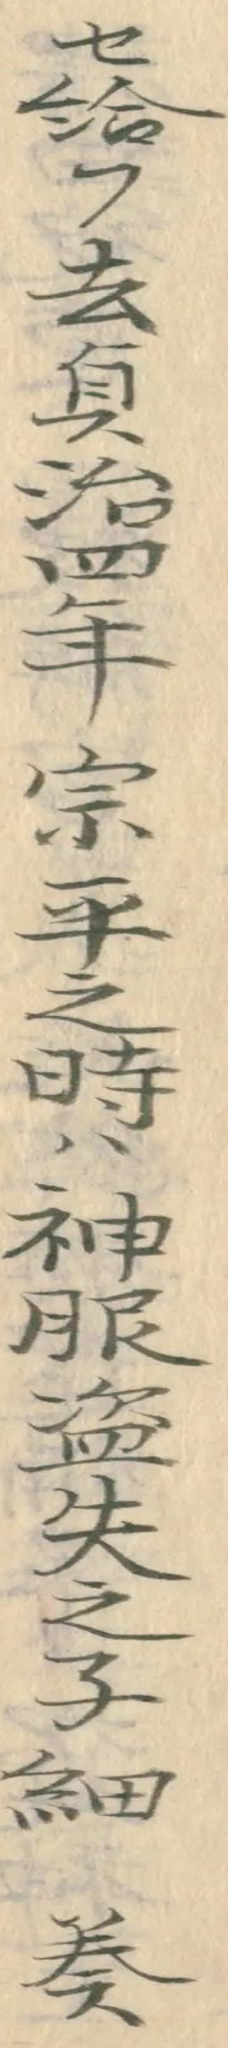セ給フ去貞治四年宗平之時ハ神服盗失之子細奏
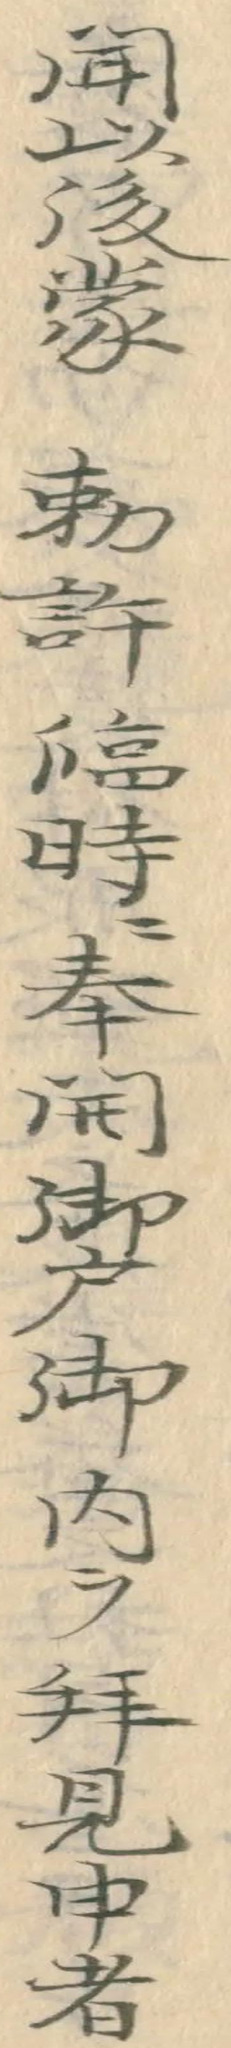聞以後蒙勅許臨時ニ奉開御戸御内ヲ拝見申者
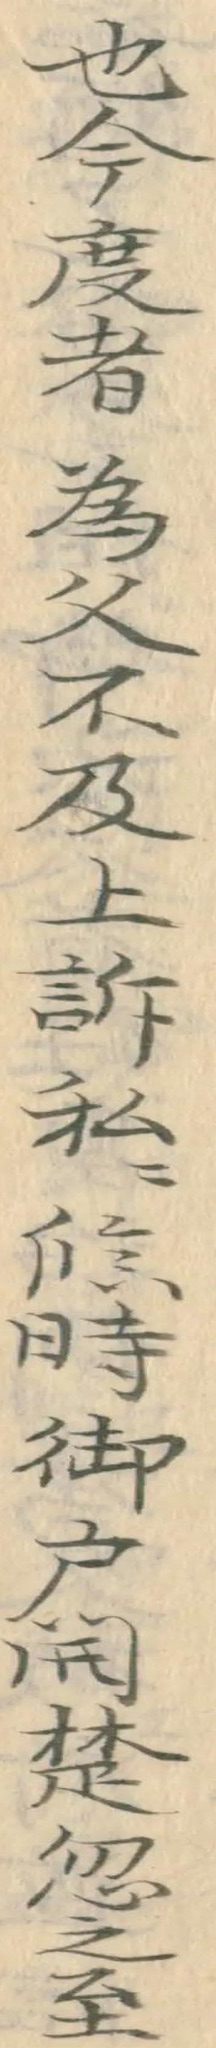也今度者為久不及上訴私ニ臨時御戸開楚忽之至

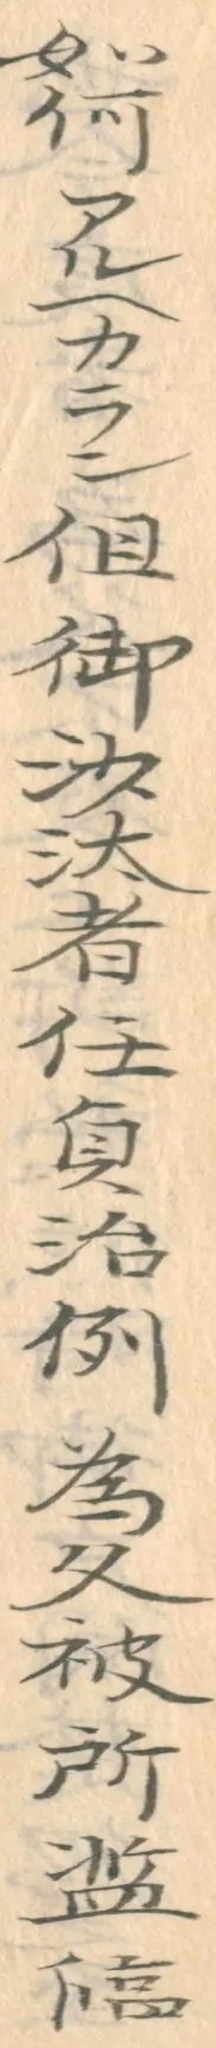如何アルヘカラン但御沙汰者任貞治例為久被所濫臨
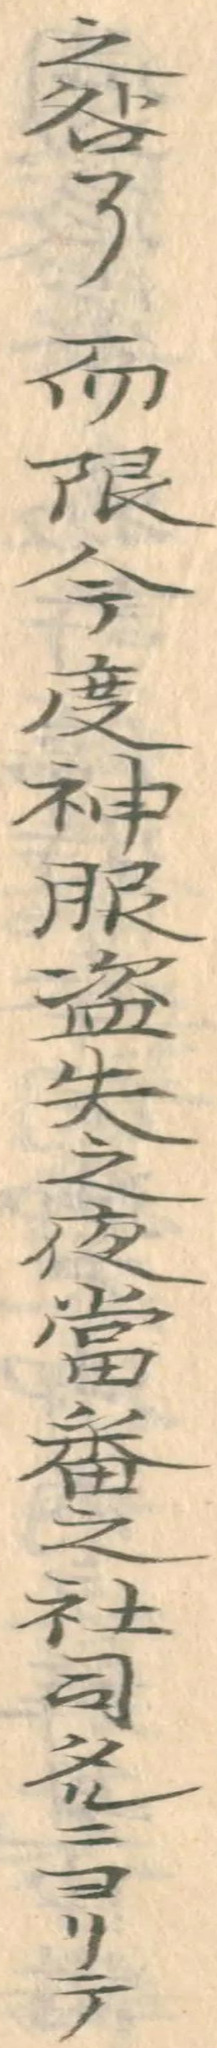之咎了而限今度神服盗失之夜当番之社司タルニヨリテ
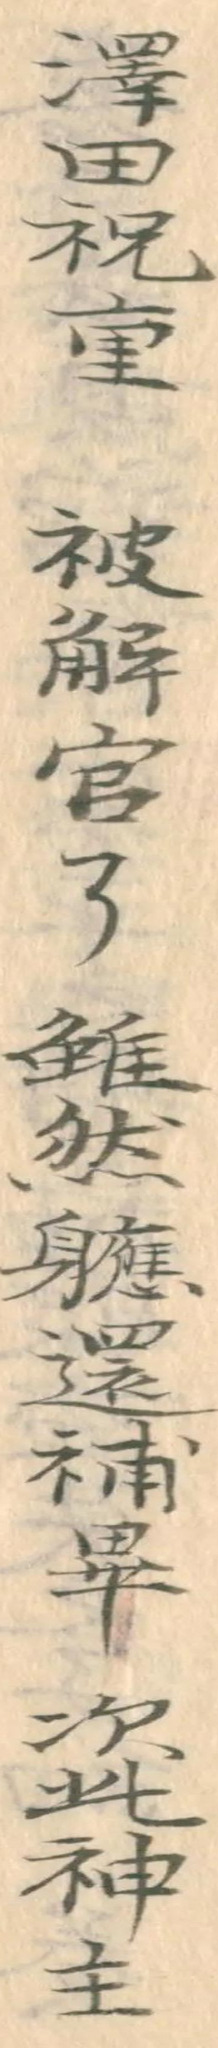澤田祝重被解官了雖然軈還補畢次此神主
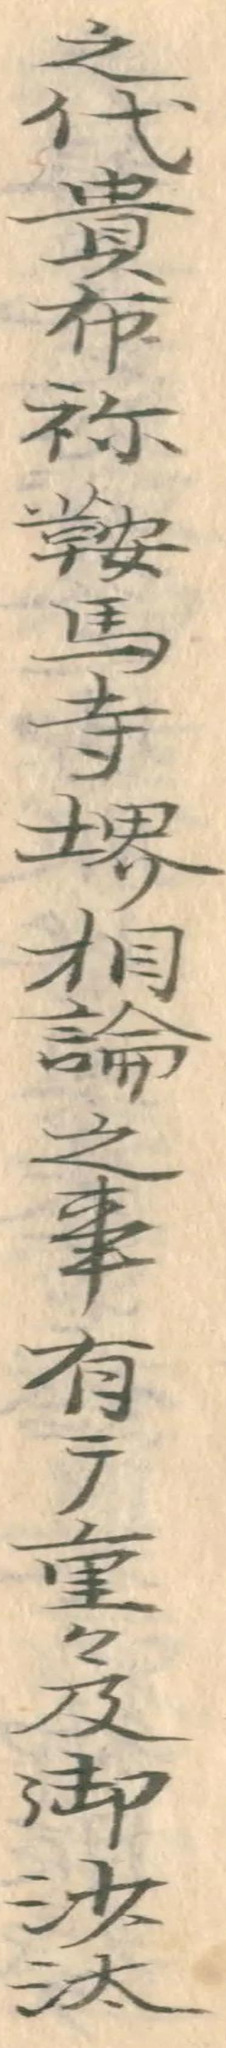之代貴布祢鞍馬寺堺相論之事有テ重々及御沙汰
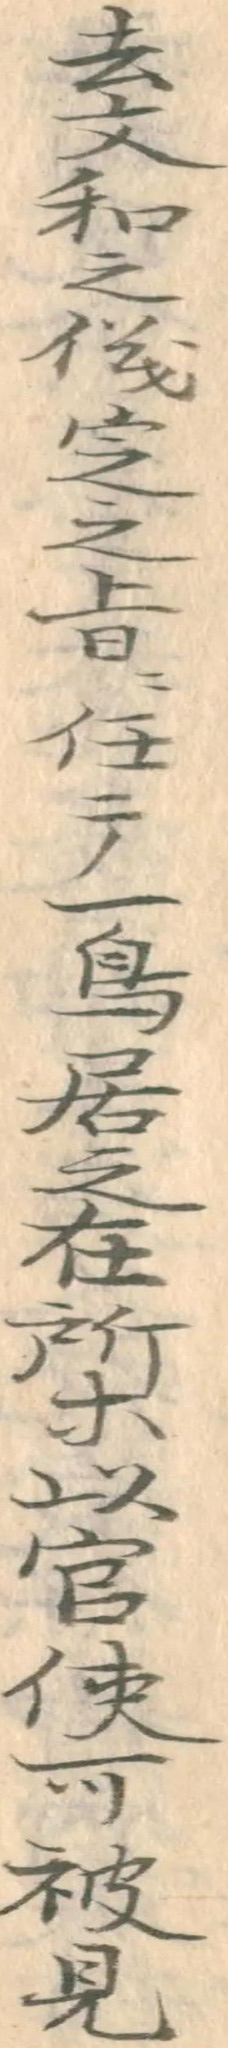去文和之儀定之旨ニ任テ一鳥居之在所等以官使可被見
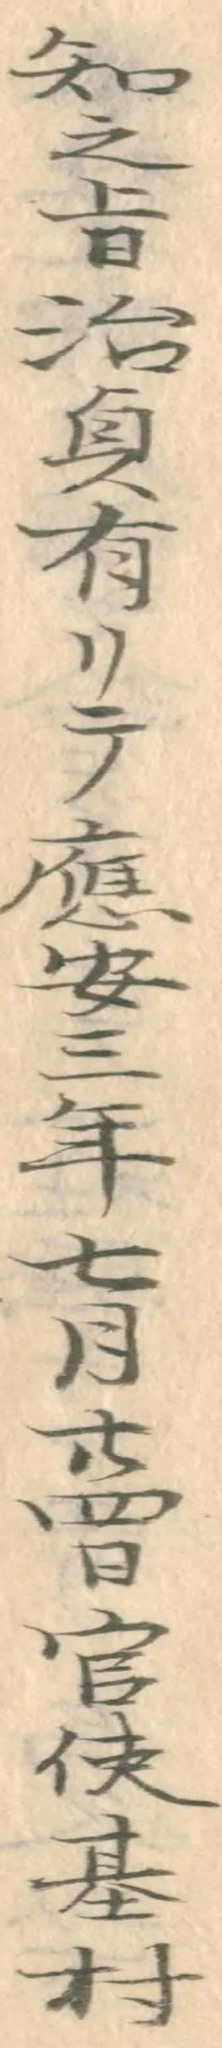知之旨治貞有リテ応安三年七月廿四日官使基村
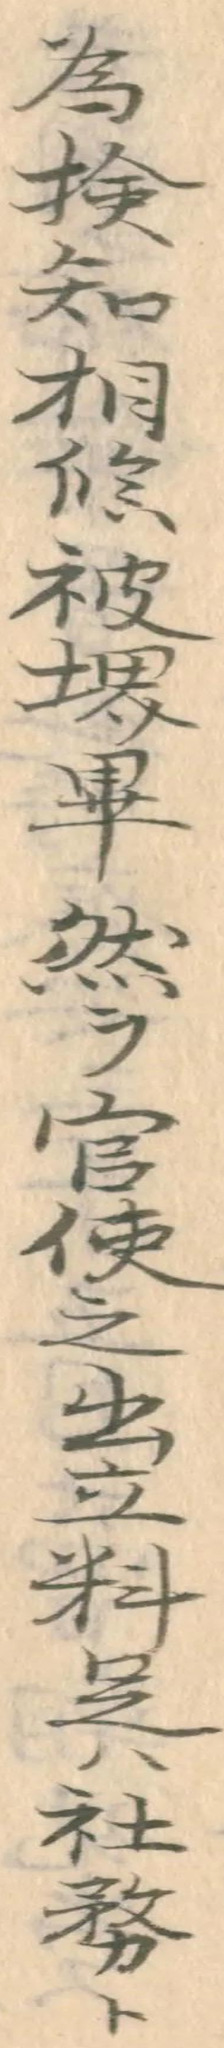為検知相臨被堺畢然ヲ官使之出立料足ハ社務ト
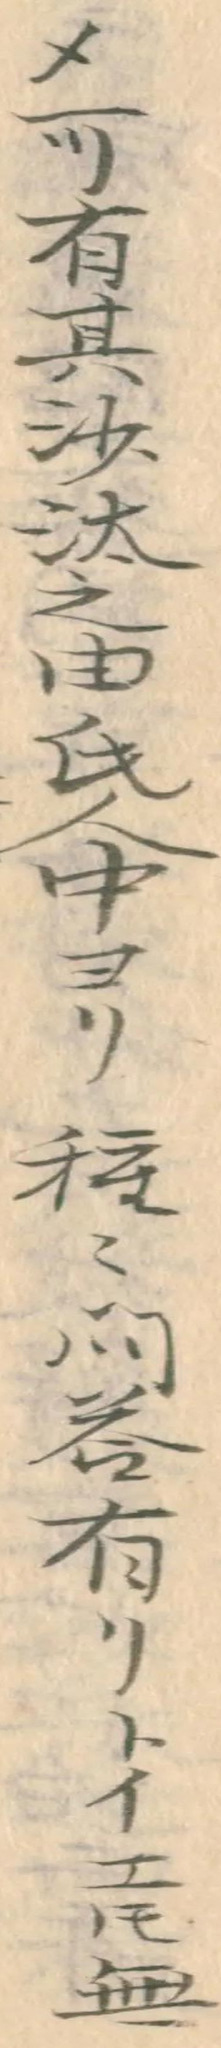メ可有其沙汰之由氏人中ヨリ種々問答有リトイエトモ無
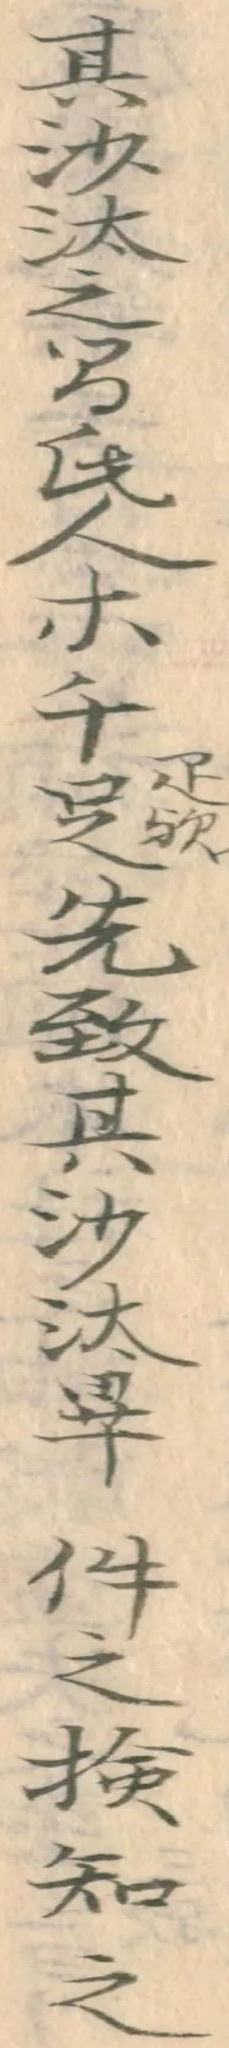其沙汰之間氏人等千足先致其沙汰畢件之検知之
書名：賀茂社記録. 第24冊
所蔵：国立国会図書館 National Diet Library, JAPAN
